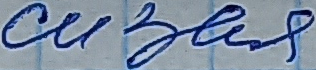сизая
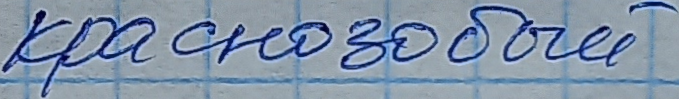краснозобый
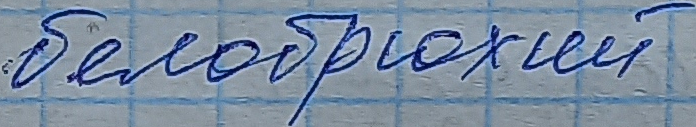белобрюхий
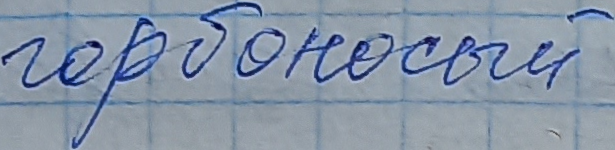горбоносый
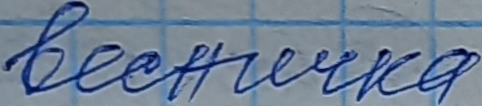весничка
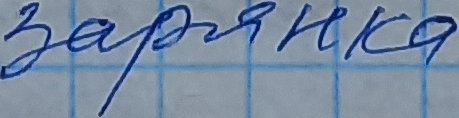зарянка
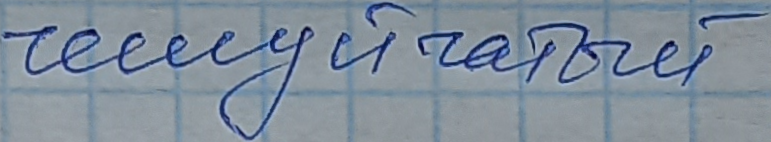чешуйчатый
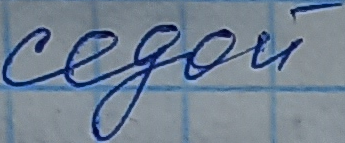седой
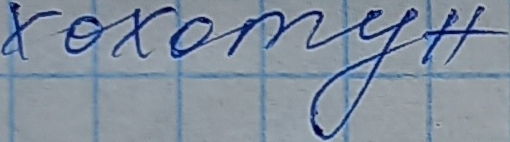хохотун
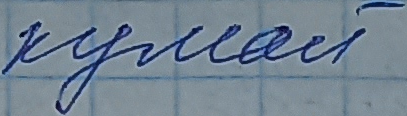кумай
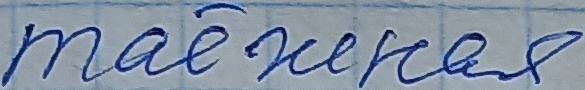таёжная
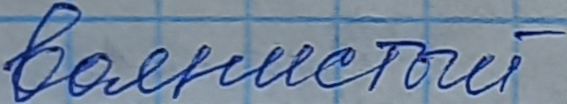волнистый
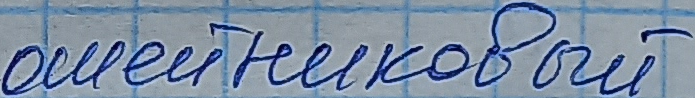ошейниковый
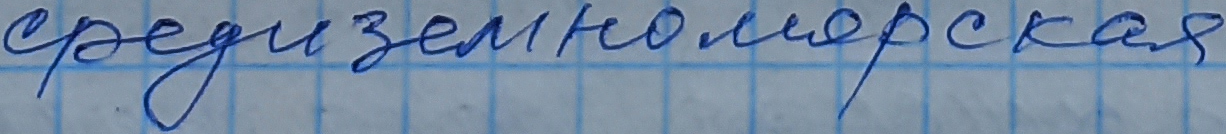средиземноморская
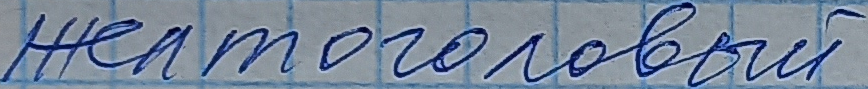желтоголовый
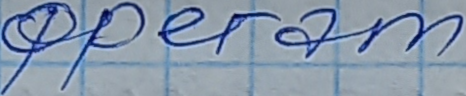фрегат
